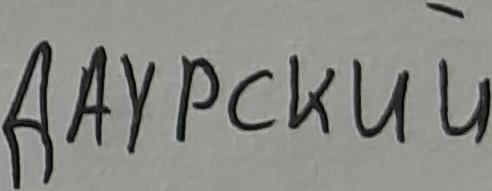даурский
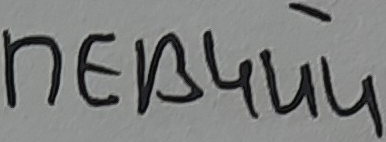певчий
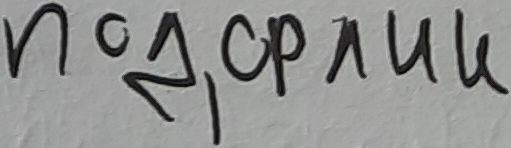подорлик
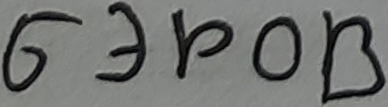бэров
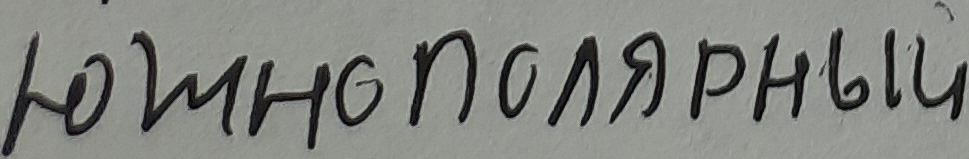южнополярный
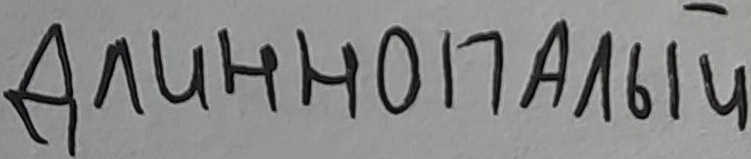длиннопалый
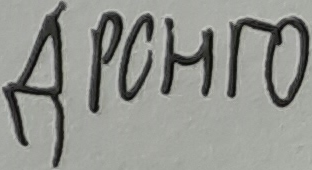дронго
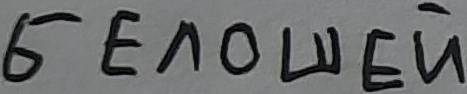белошей
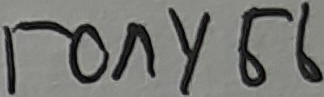голубь
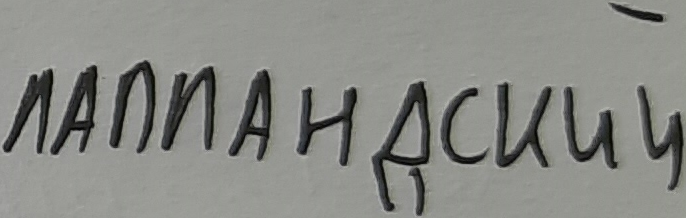лапландский
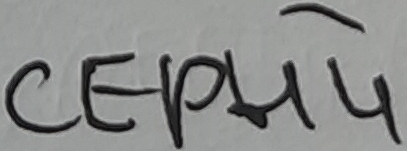серый
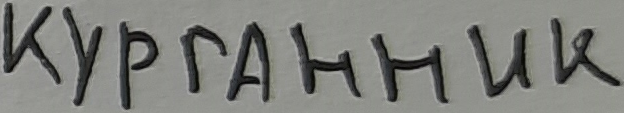курганник
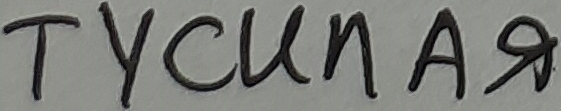тусклая
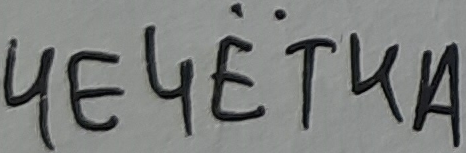чечётка
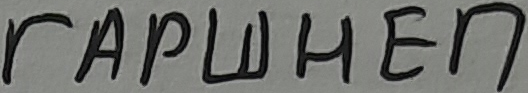гаршнеп
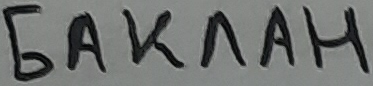баклан
